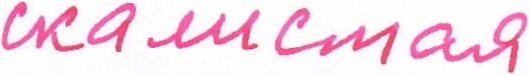скалистая
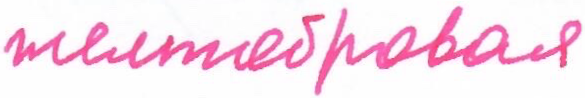желтобровая
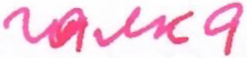галка
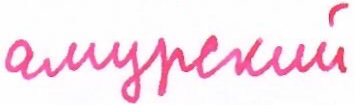амурский
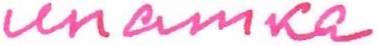ипатка
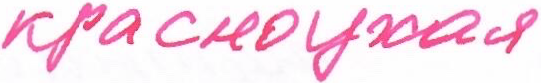красноухая
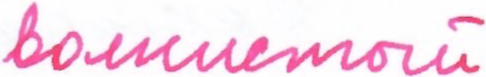волнистый
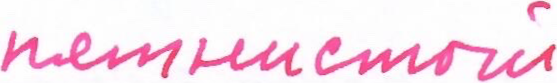пятнистый
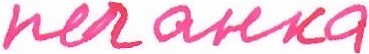пеганка
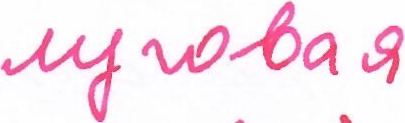луговая
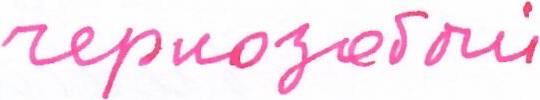чернозобый
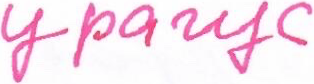урагус
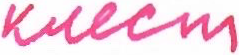клест
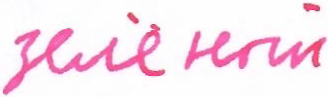зелёный
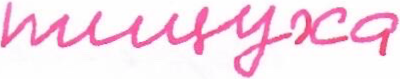пищуха
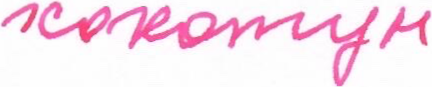хохотун
